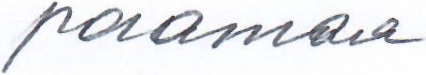рогатая
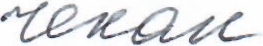чекан
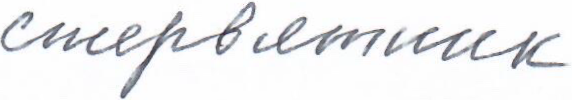стервятник
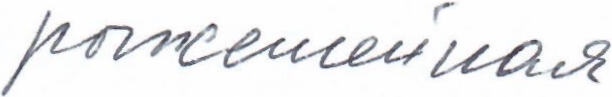рыжешейная
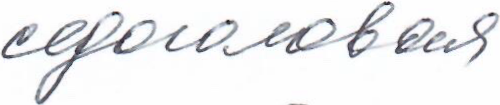седоголовая
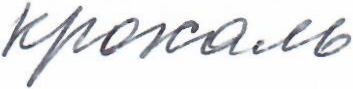крохаль
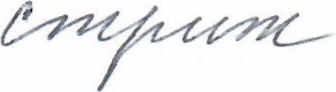стриж
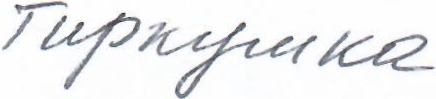тиркушка
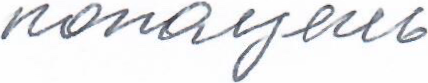поползень
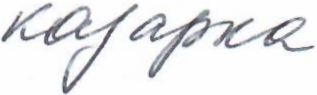казарка
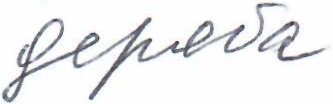деряба
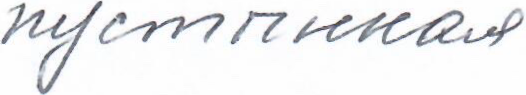пустынная
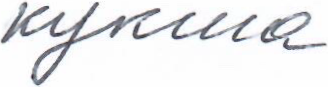кукша
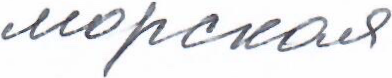морская
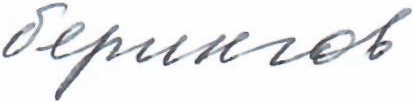берингов
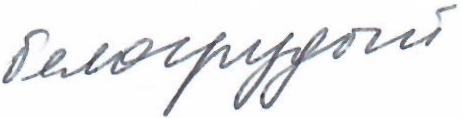белогрудый
